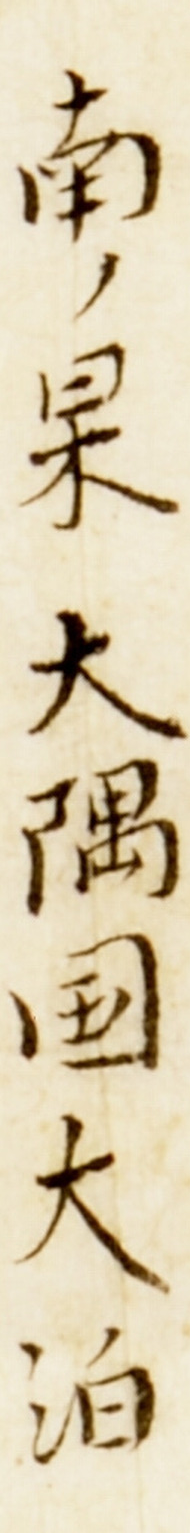南ノ果大隅国大泊
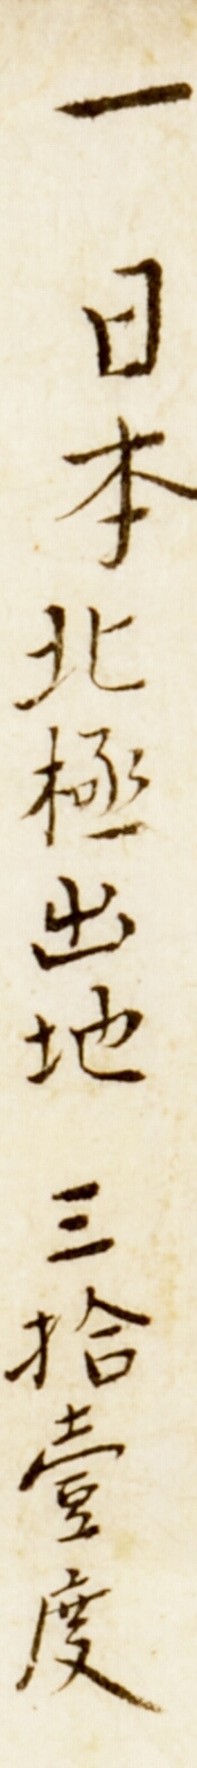日本北極出地三拾壱度
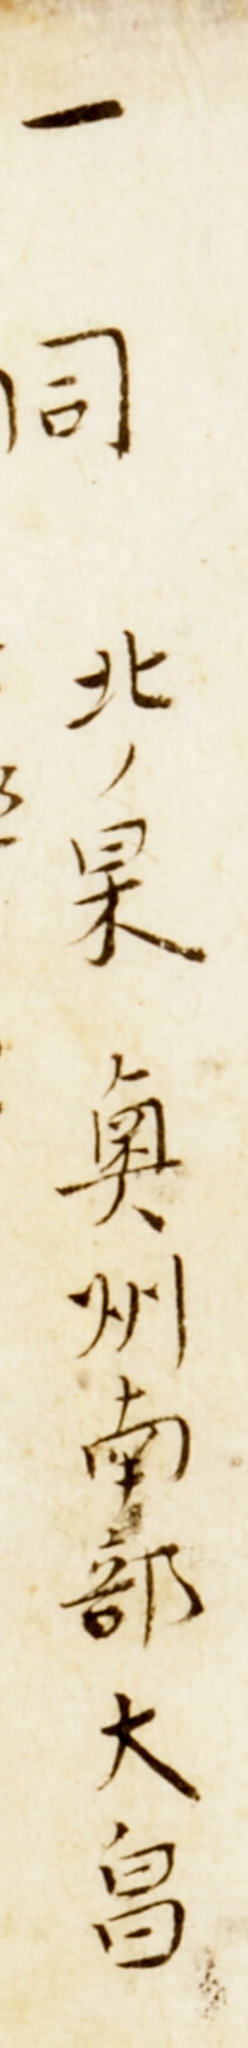同北ノ果奥州南部大白日
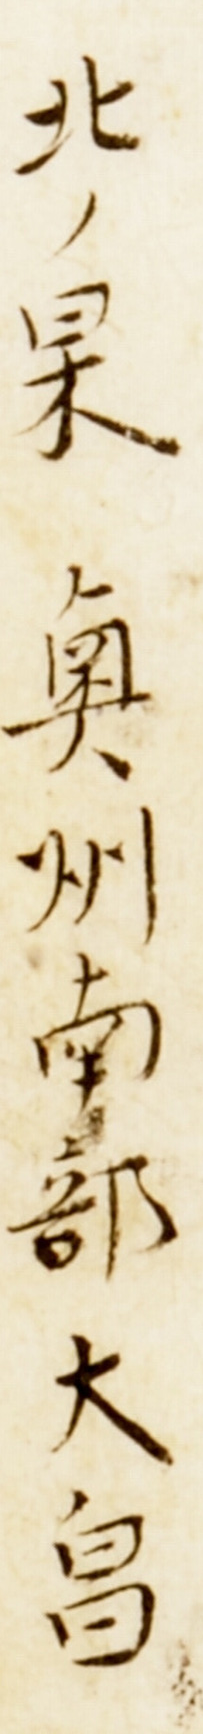同北ノ果奥州南部大白日
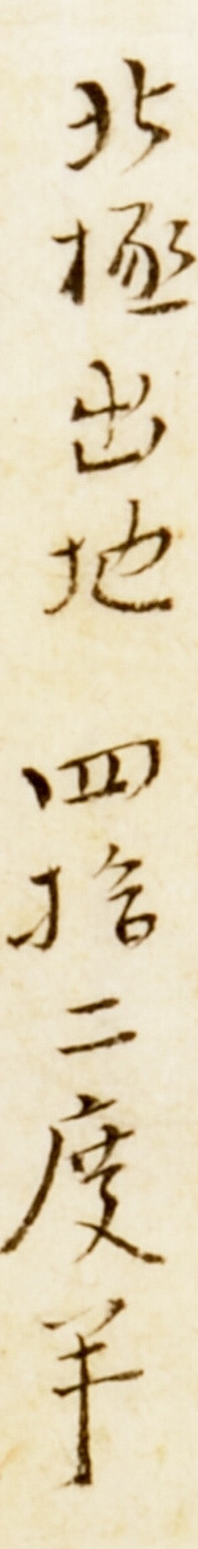北極出地四拾二度半
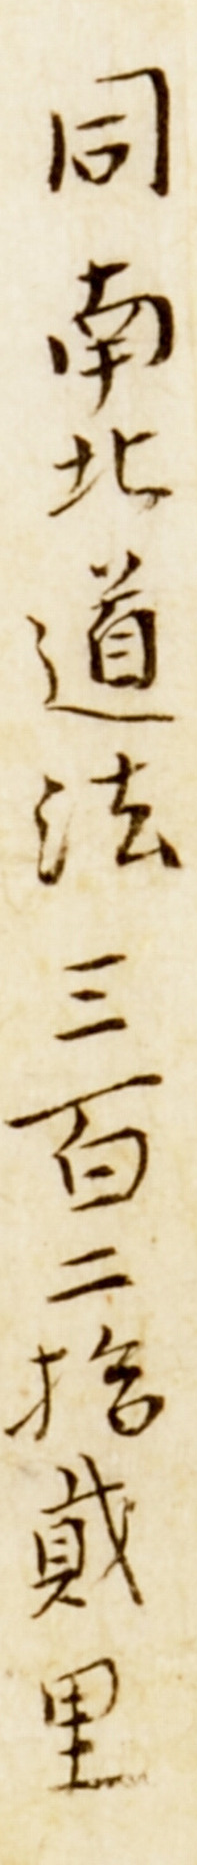同南北道法三百二拾弐里
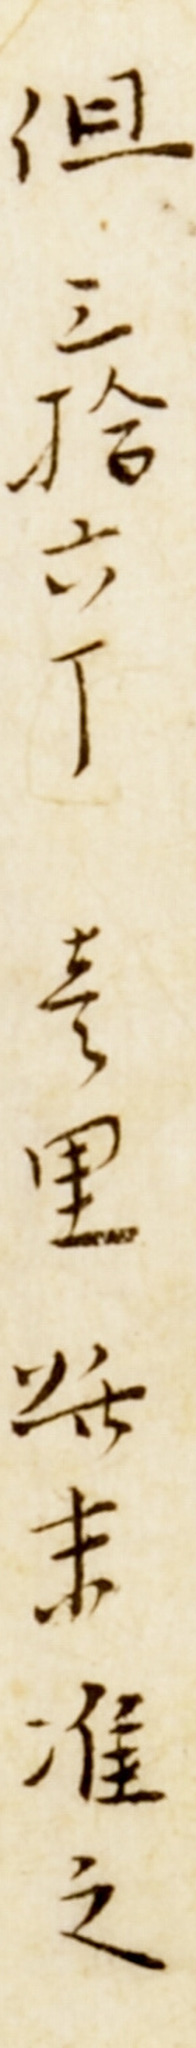但三拾六丁壱里此末准之
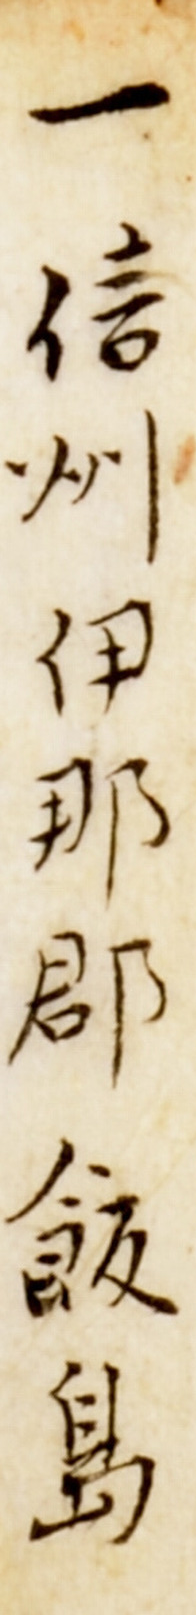信州伊那郡飯島
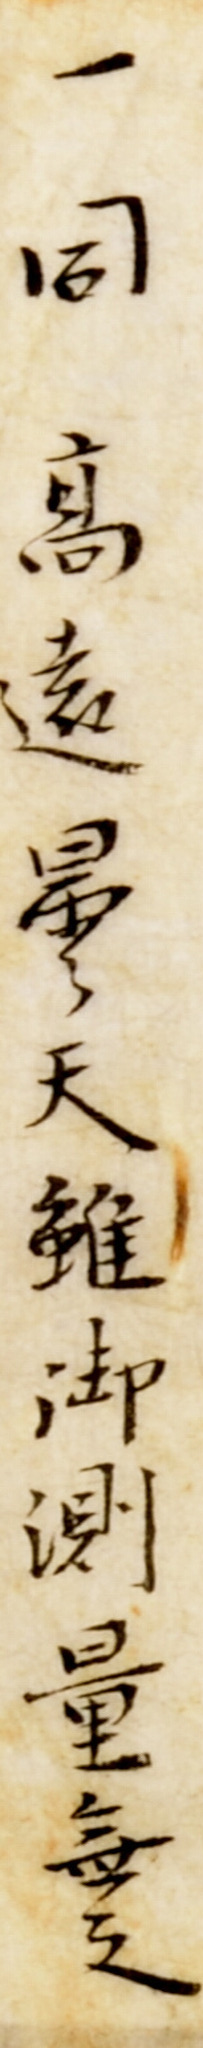同高遠曇天雖御測量無之
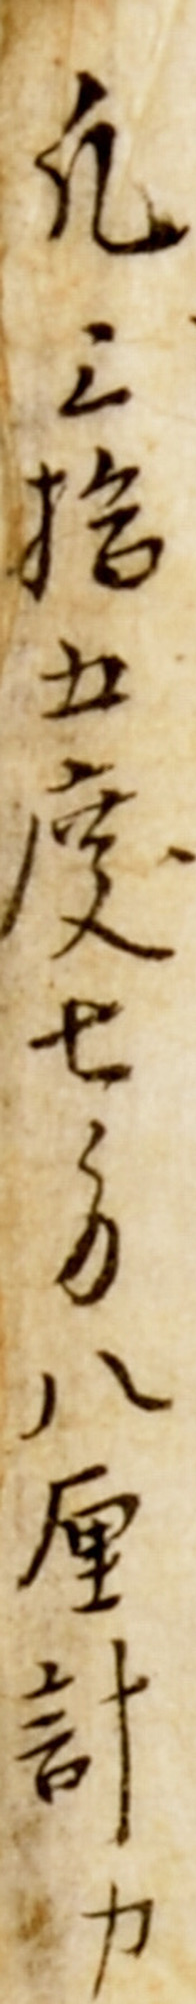凡三拾五度七分八厘計カ

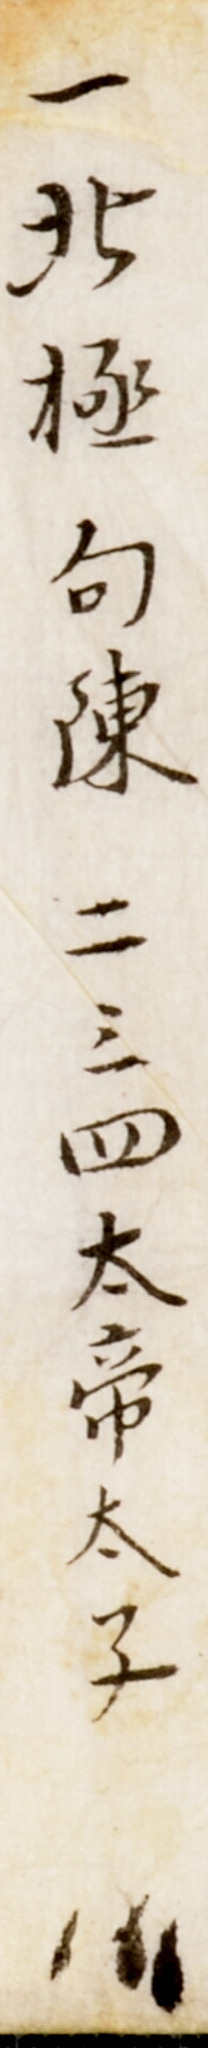一北極句陳二三四太帝太子
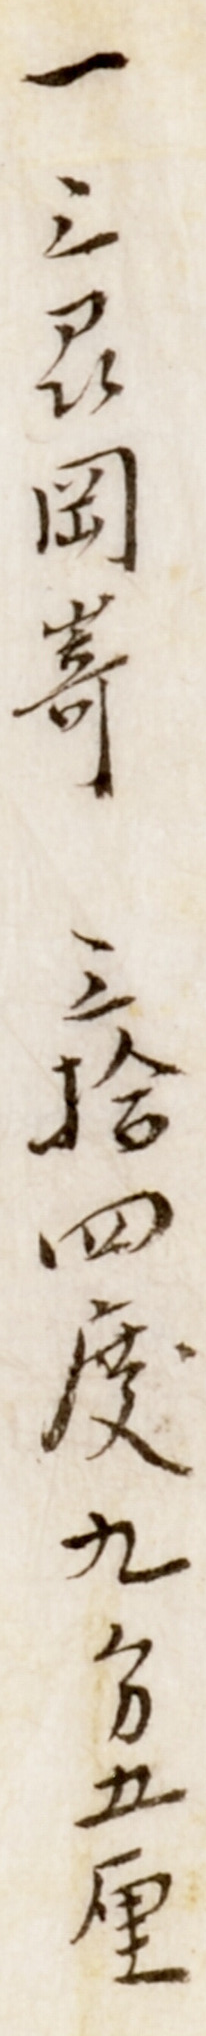一三州岡嵜三拾四度九分五厘
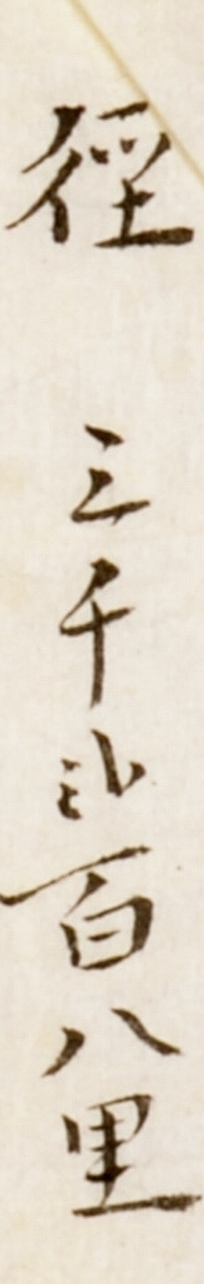径三千弐百八里
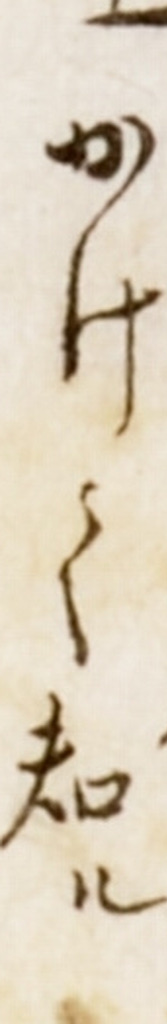かけて知ル
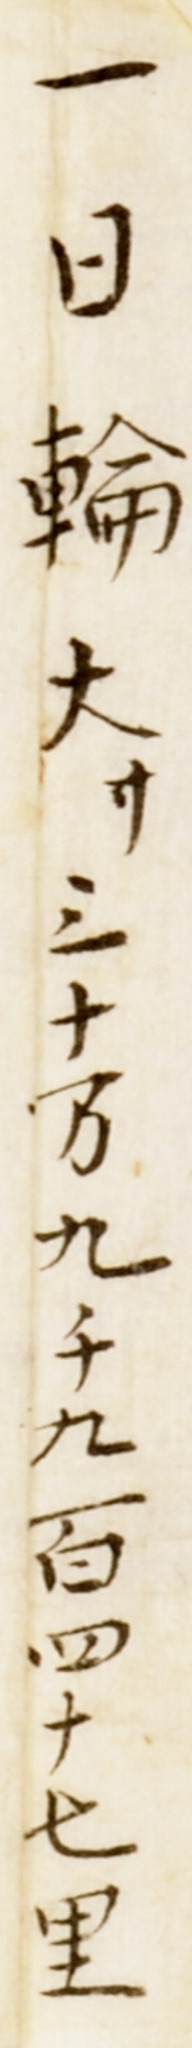一日輪大サ三十万九千九百四十七里
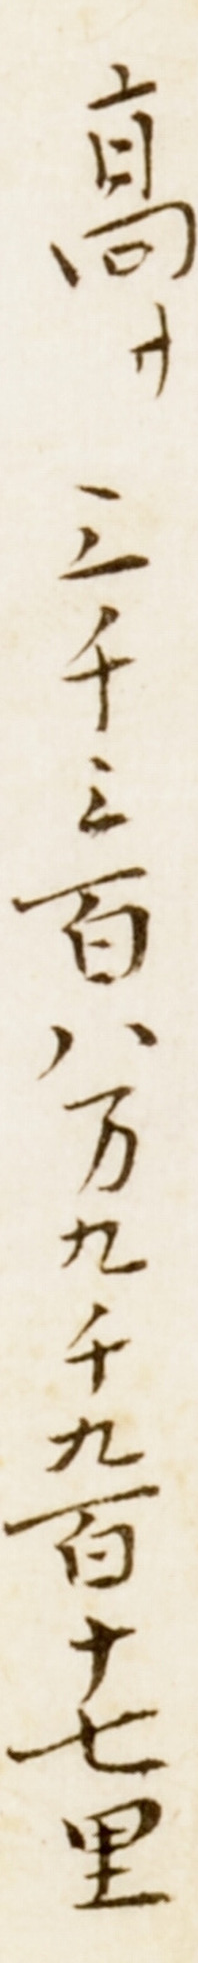高サ三千三百八万九千九百十七里
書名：御測量覚書
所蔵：伊那市立高遠町図書館・合同会社AMANE
